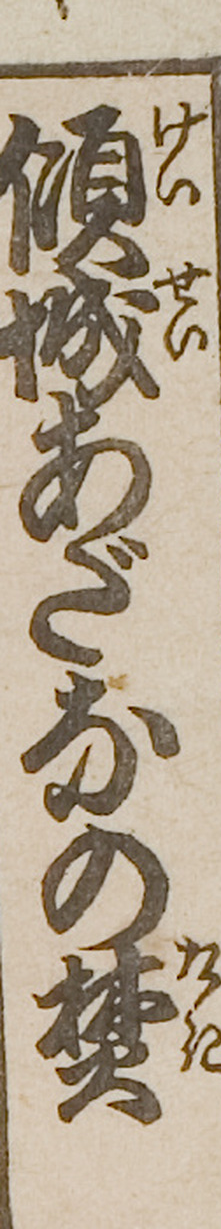傾城あだなの焚
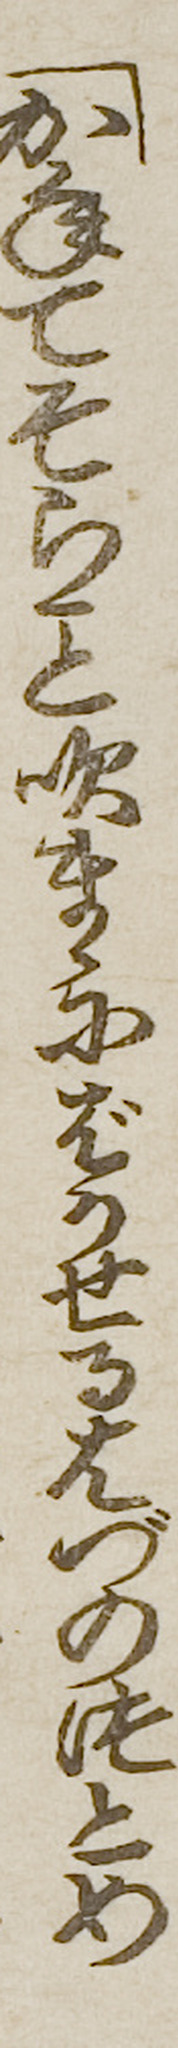〽かねてそらこと吹まゝにばかせるはづのつとめ
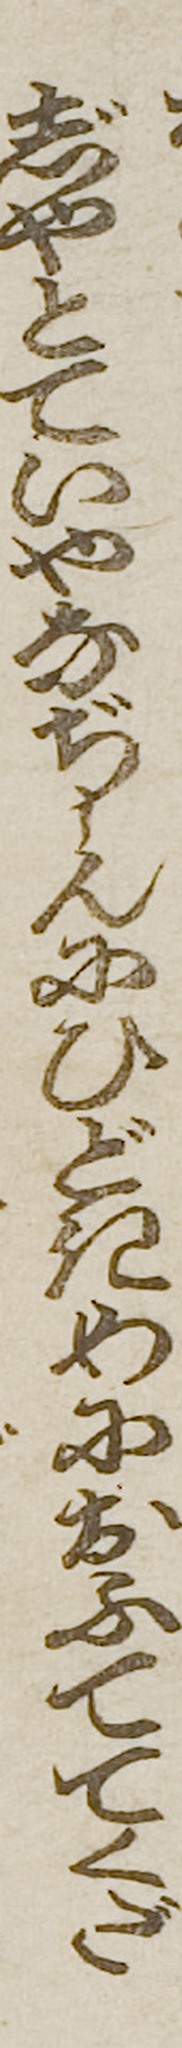じやとていやなぢしんにひどきめにおふててくだ
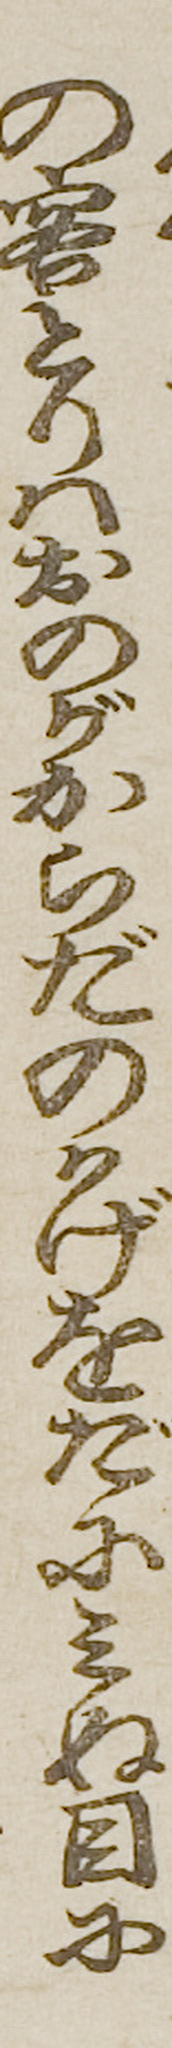の客とりはおのがからだのかげをだにみぬ目に
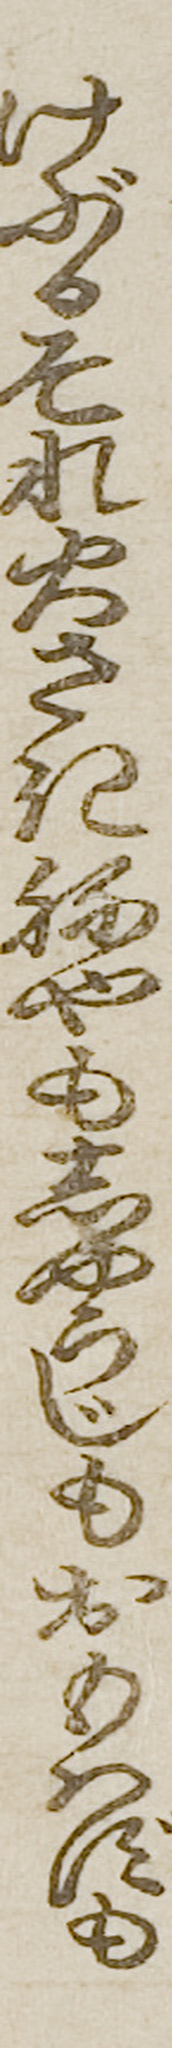けぶるそれ火さきねやもしやうじもおもはずも
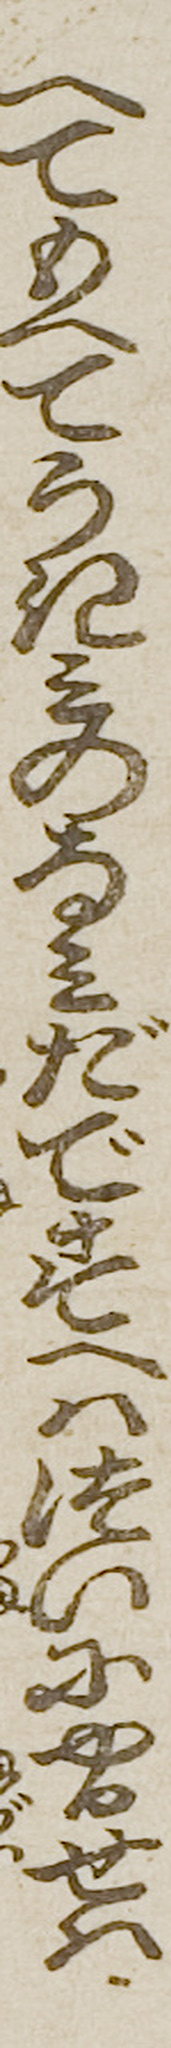へてもへてうきみのなみだですへはついにゆるせは
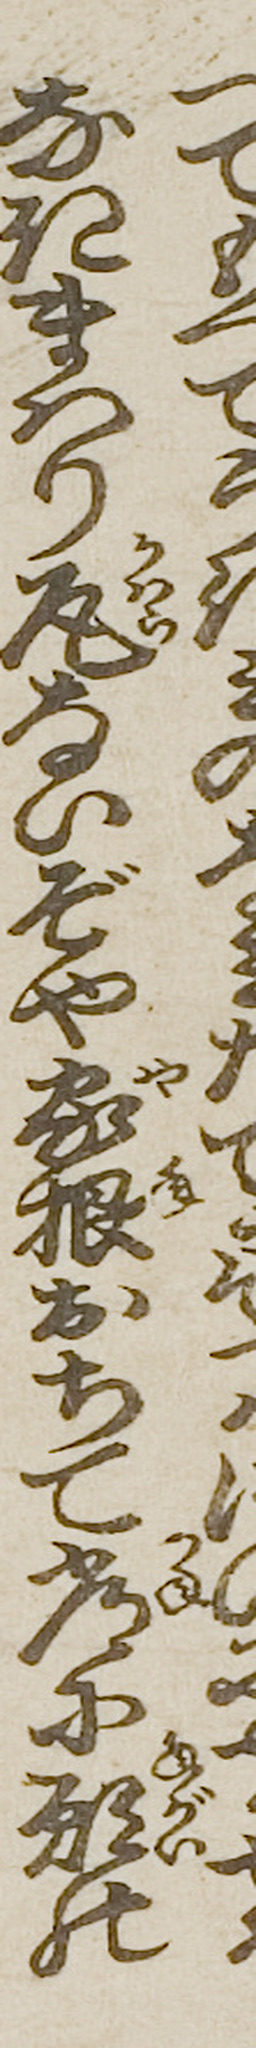なきまはり瓦ないぞや家根おちて常に願の
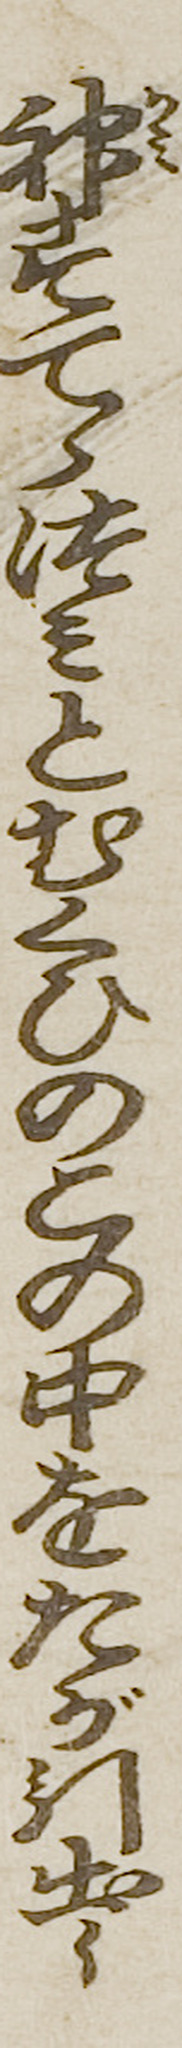神すてゝつみとむくひのこの中をたが引出し
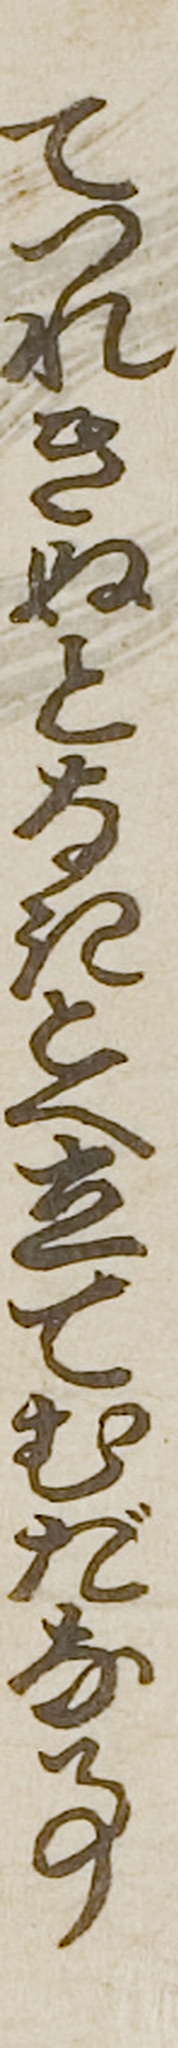てつれきぬとなきこへ立てむだな事
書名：傾城あだなの焚
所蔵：東京大学総合図書館 General Library in the University of Tokyo, JAPAN
